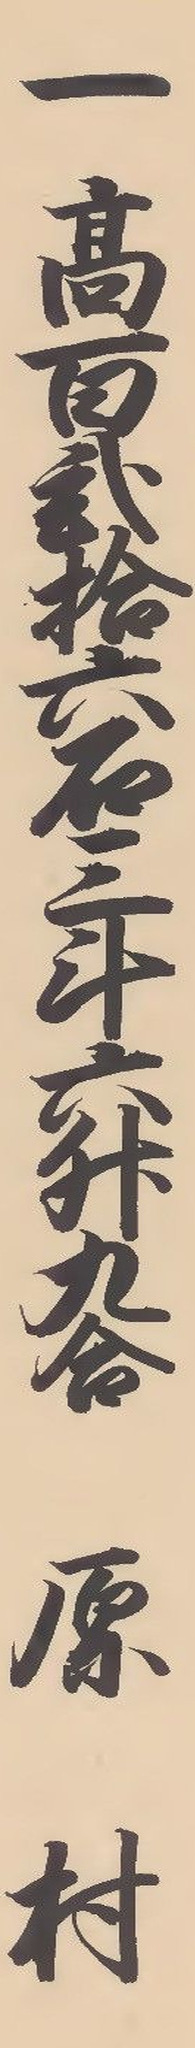一高百弐拾六石三斗六升九合原村
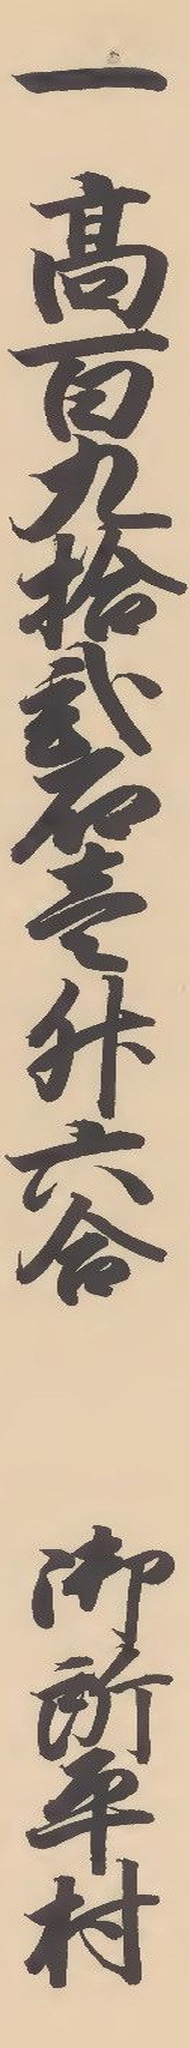一高百九拾弐石壱升六合御所平村
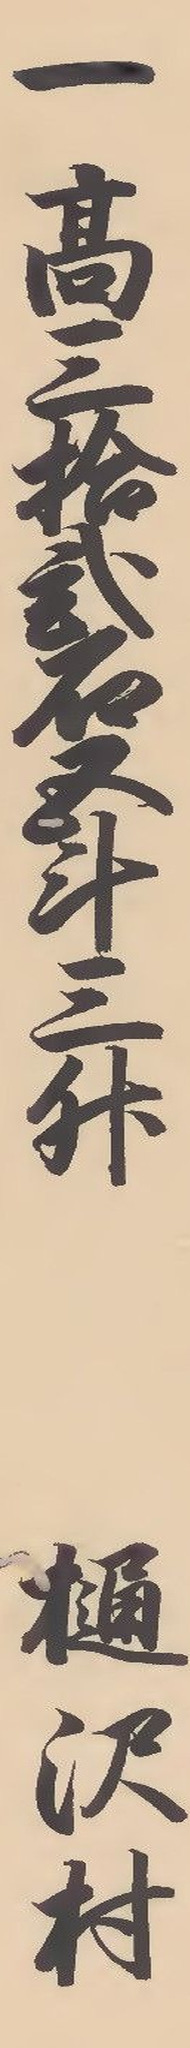一高三拾弐石五斗三升樋沢村

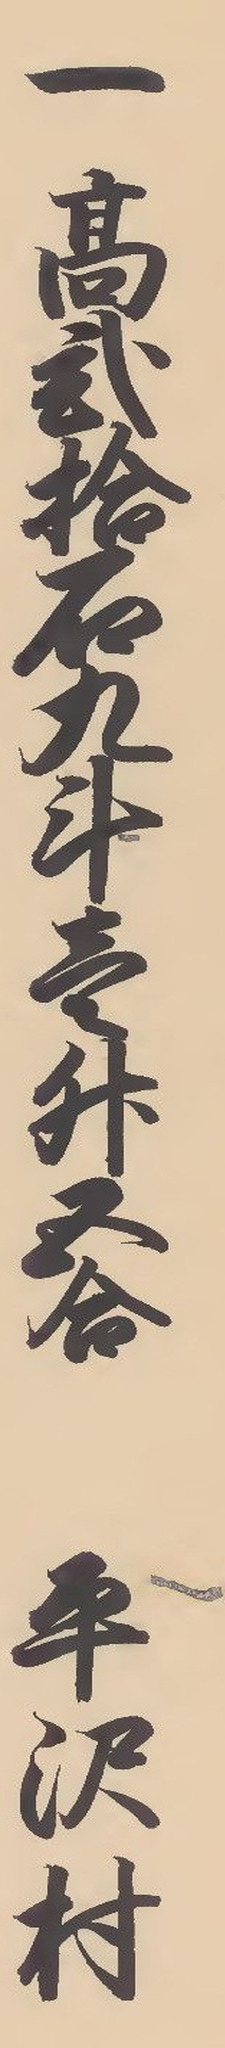一高弐拾石九斗壱升五合平沢村
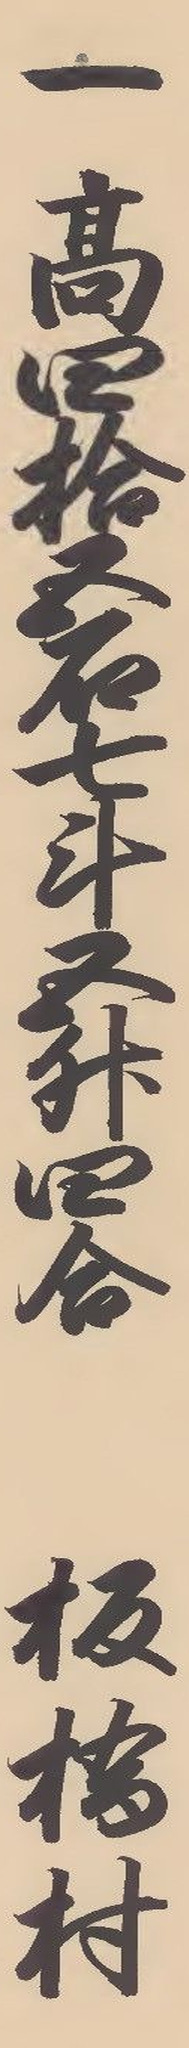一高四拾五石七斗五升四合板橋村
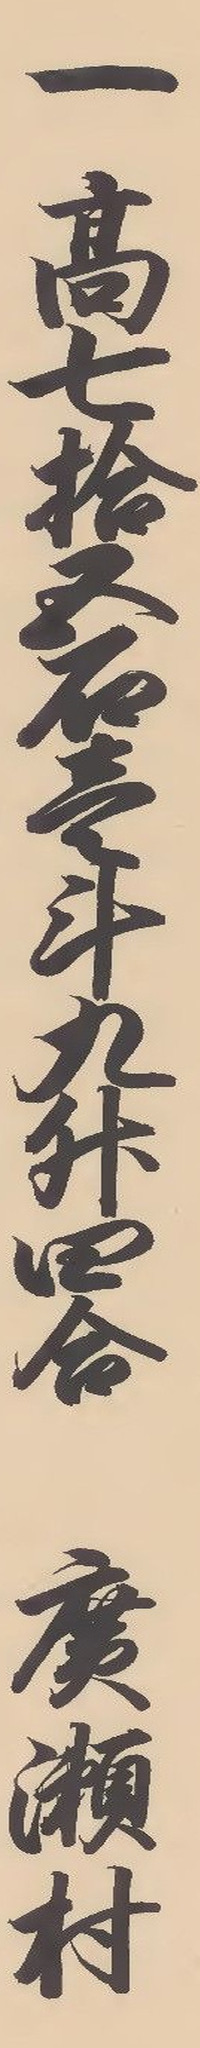一高七拾五石壱斗九升四合広瀬村
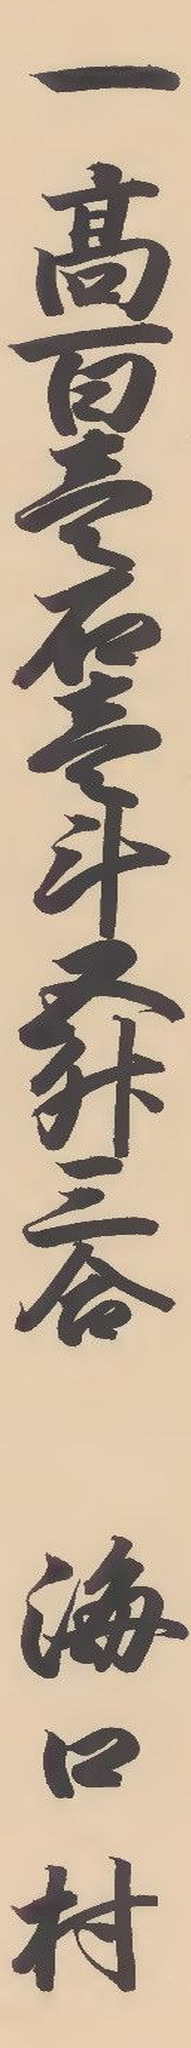一高百壱石壱斗五升三合海口村
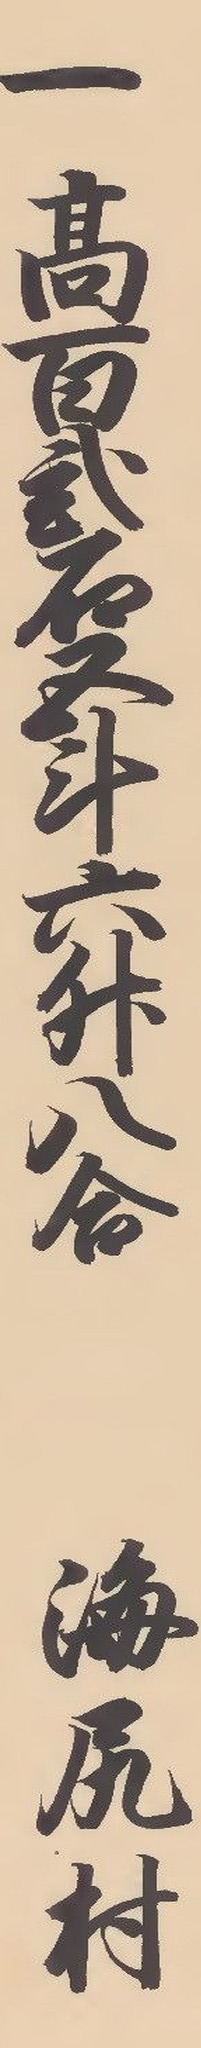一高百弐石五斗六升八合海尻村
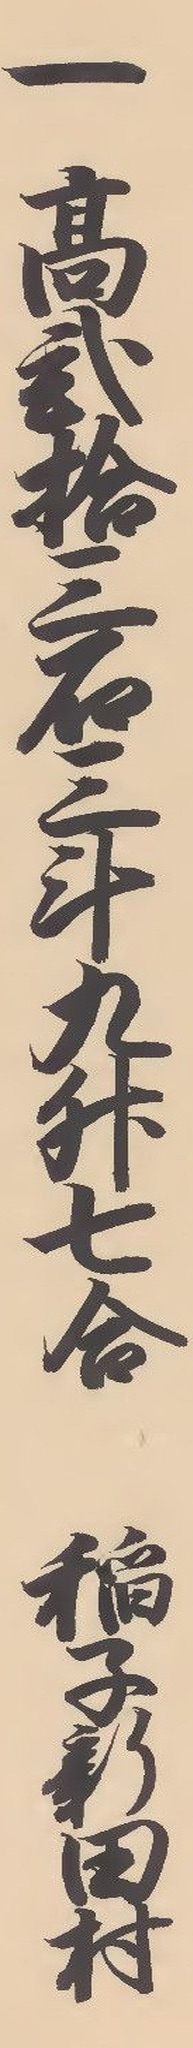一高弐拾三石三斗九升七合稲子新田村
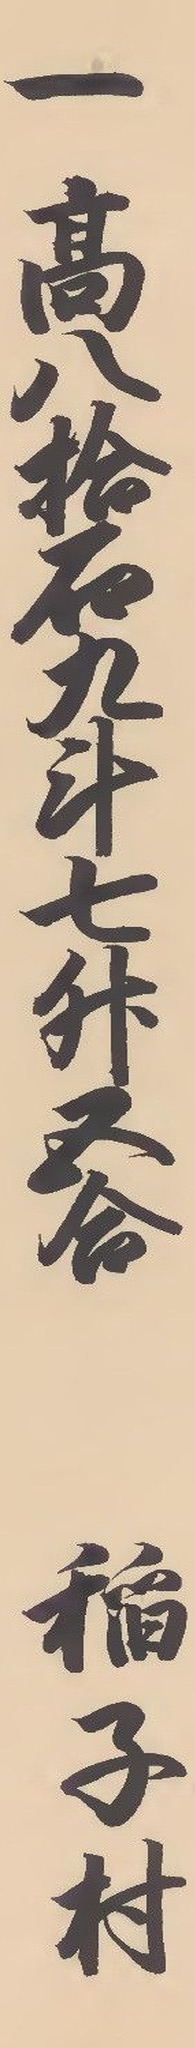一高八拾石九斗七升五合稲子村

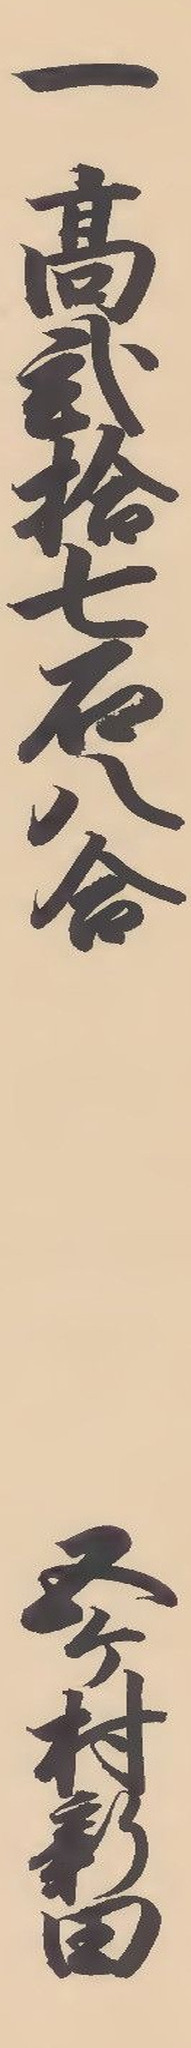一高弐拾七石八合五ヶ村新田
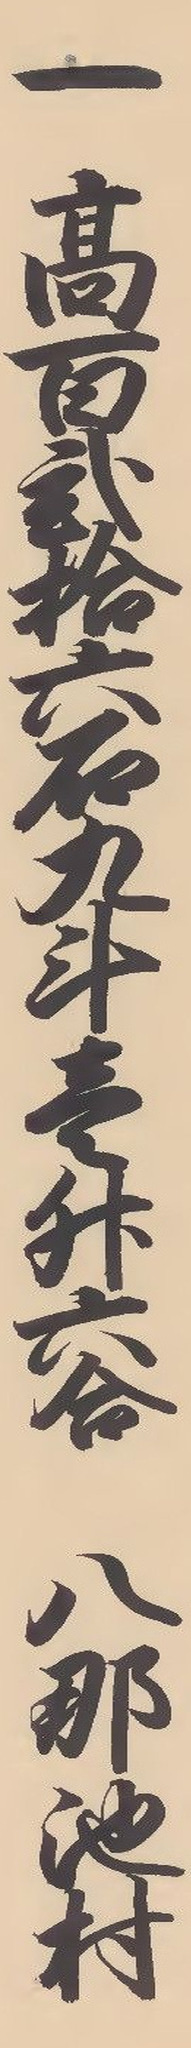一高百弐拾六石九斗壱升六合八那池村
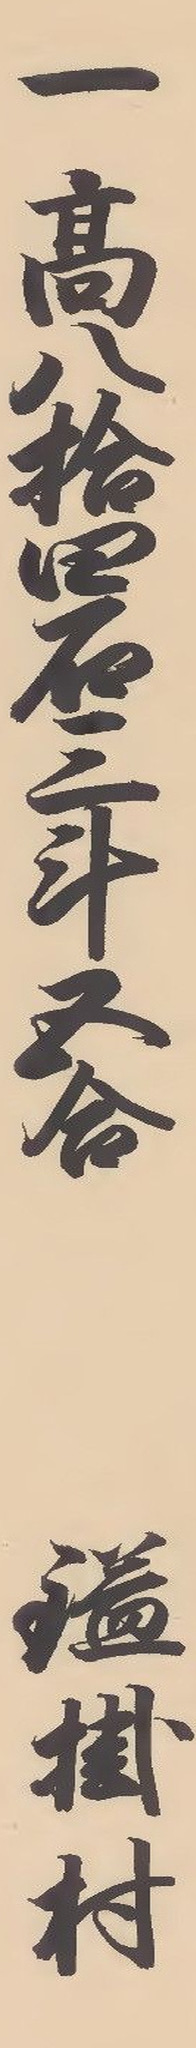一高八拾四石三斗五合鎰掛村
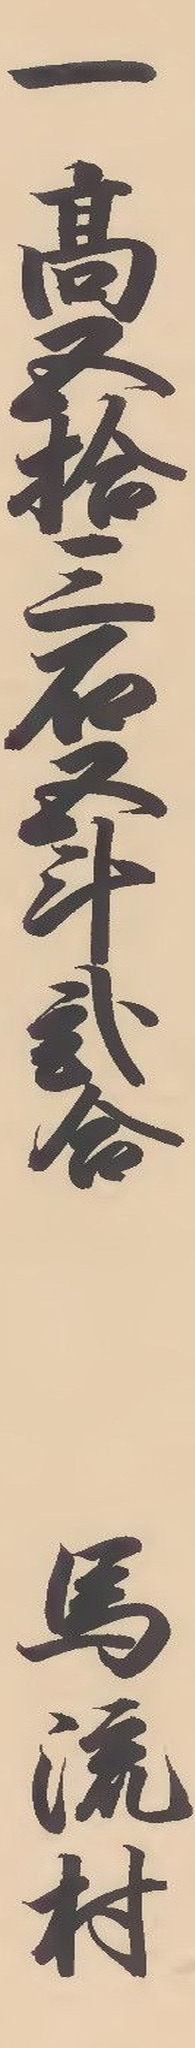一高五拾三石五斗弐合馬流村
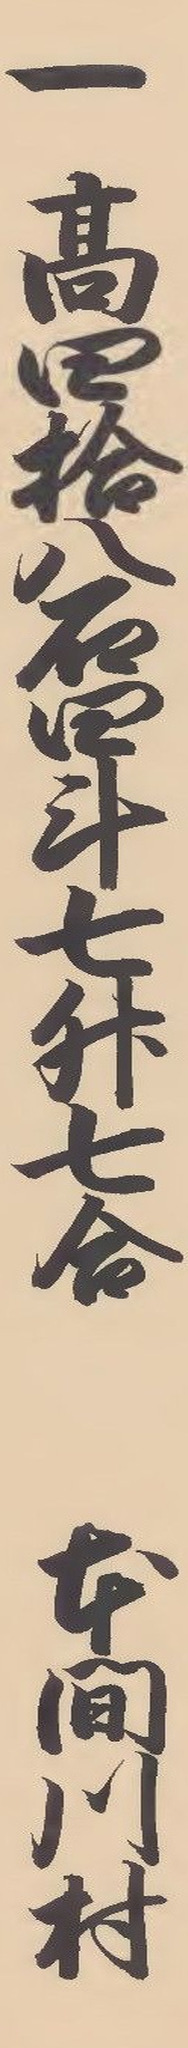一高四拾八石四斗七升七合本間川村
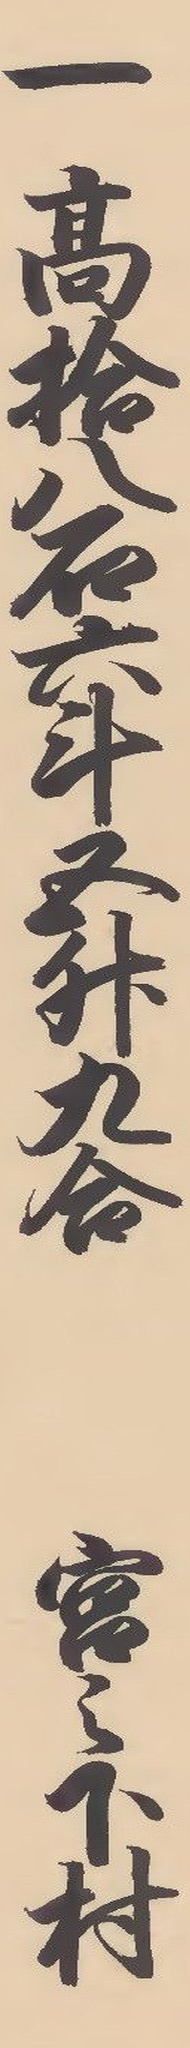一高拾八石六斗五升九合宮之下村
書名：信濃国郷帳
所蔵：国立公文書館 National Archives of Japan
